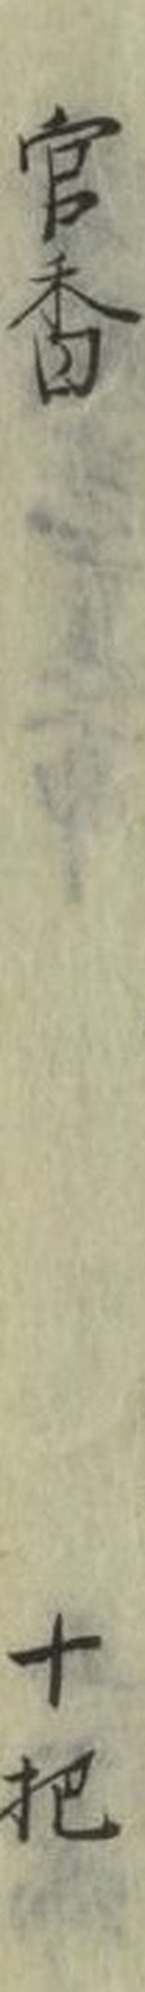官香十把
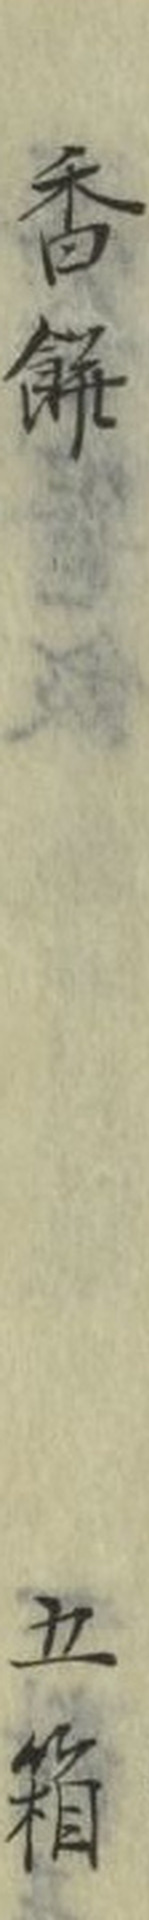香餅五箱
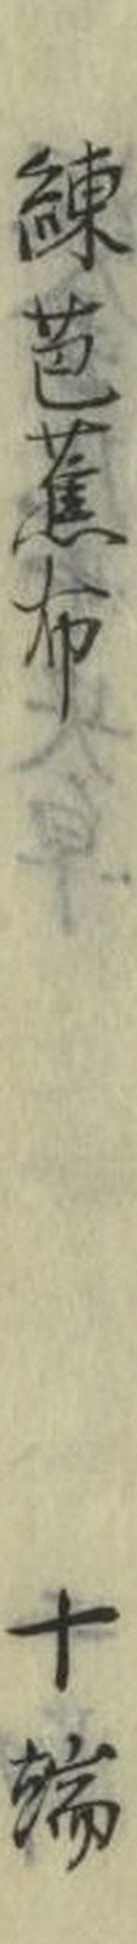練芭蕉布十端
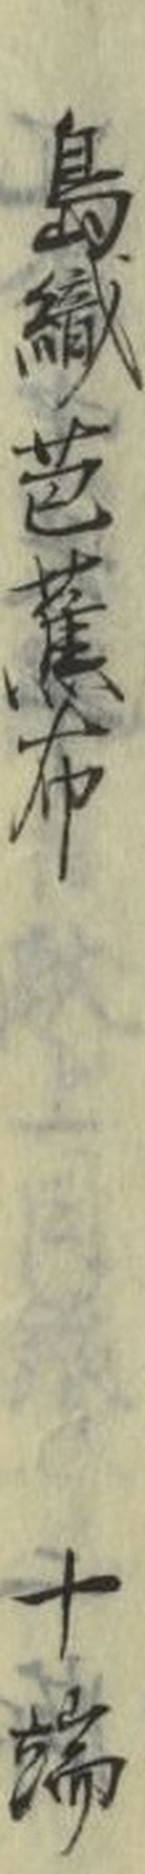島織芭蕉布十端
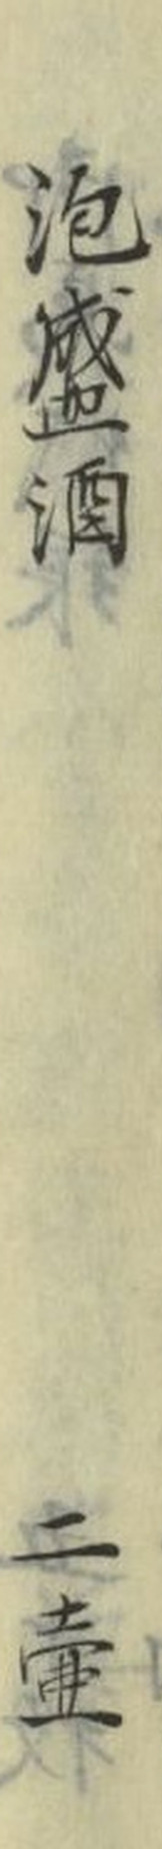泡盛酒二壺
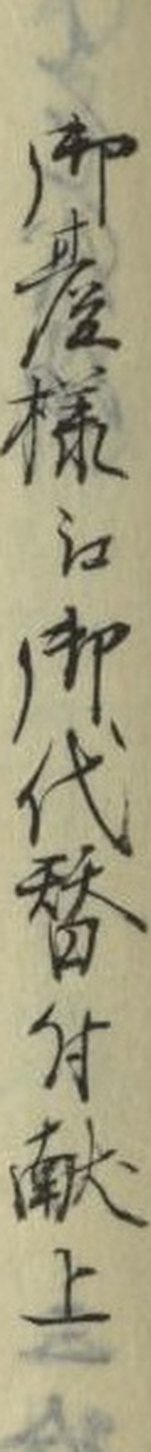御台様え御代替付献上
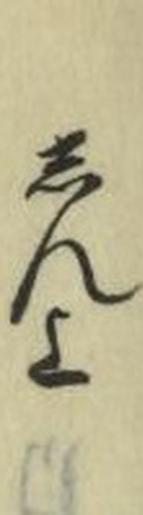しん上
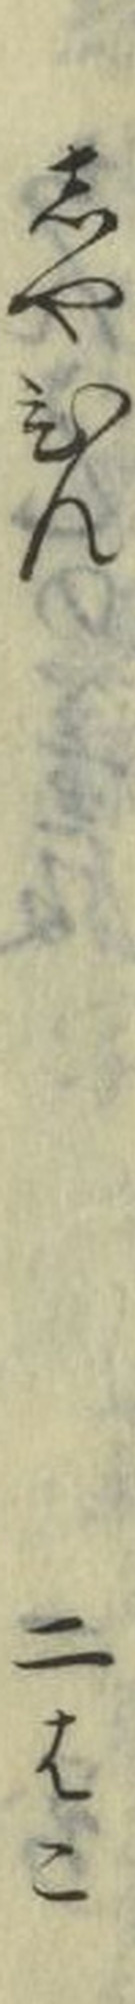しやひん二はこ
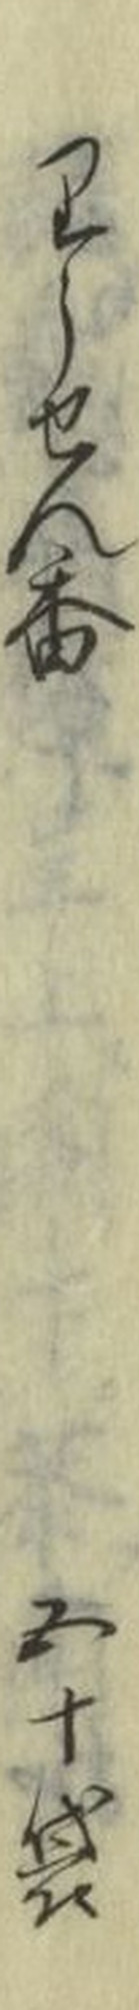りうせん香五十袋
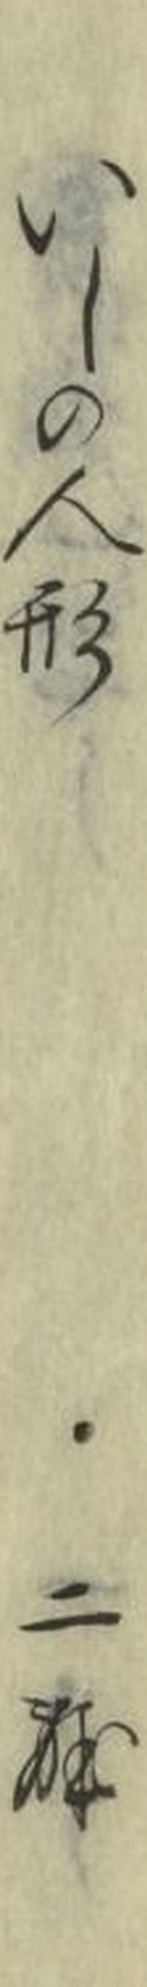いしの人形二体
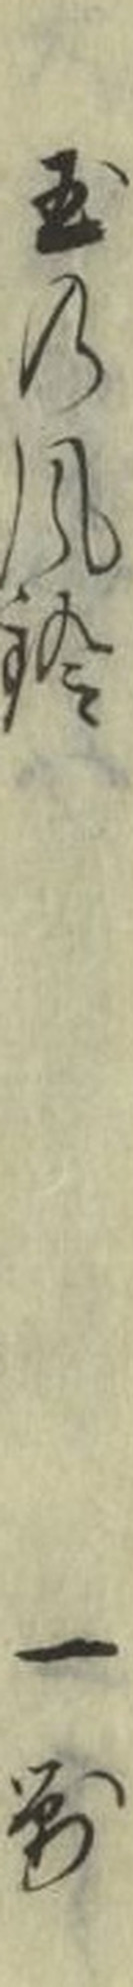玉の風鈴一対
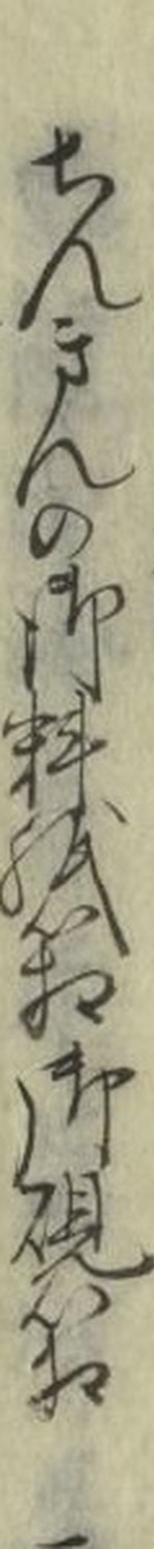ちんきんの御料紙箱御硯箱二通
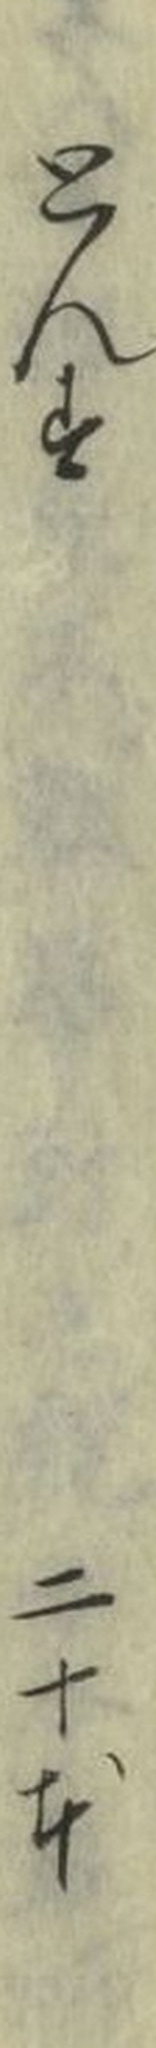とんす二十本
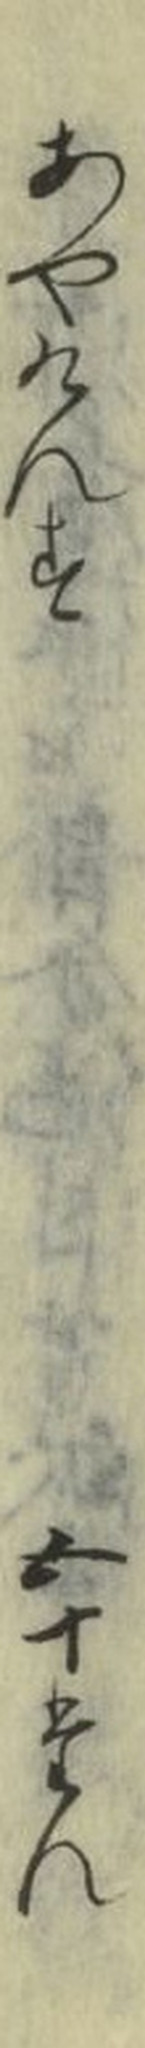あやけんす五十たん
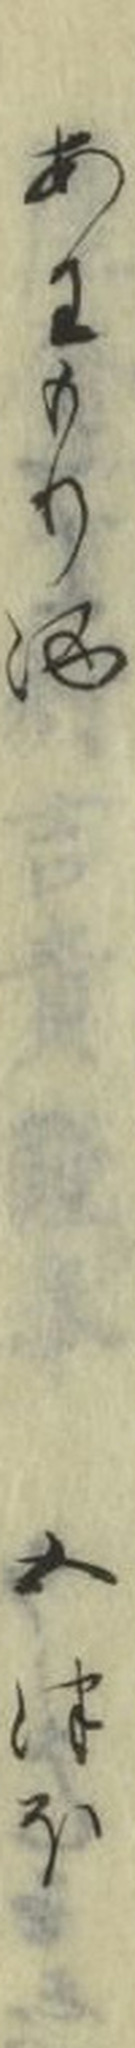あわもり酒五つほ

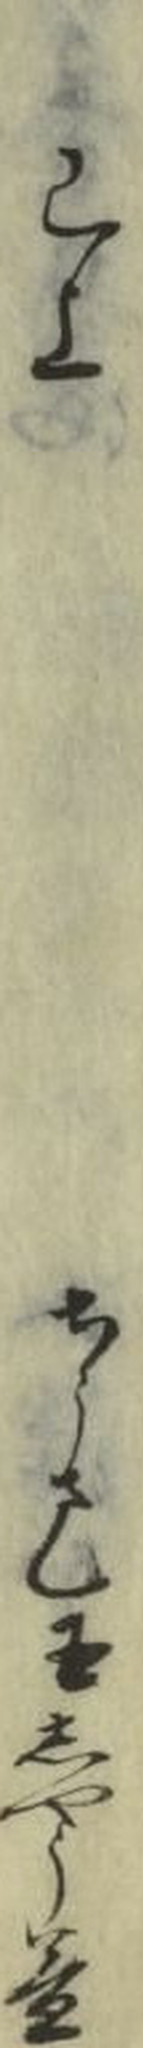已上ちうさん王しやう益
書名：宝永七庚寅年琉球国来聘使日記
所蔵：University of the Ryukyus Library
